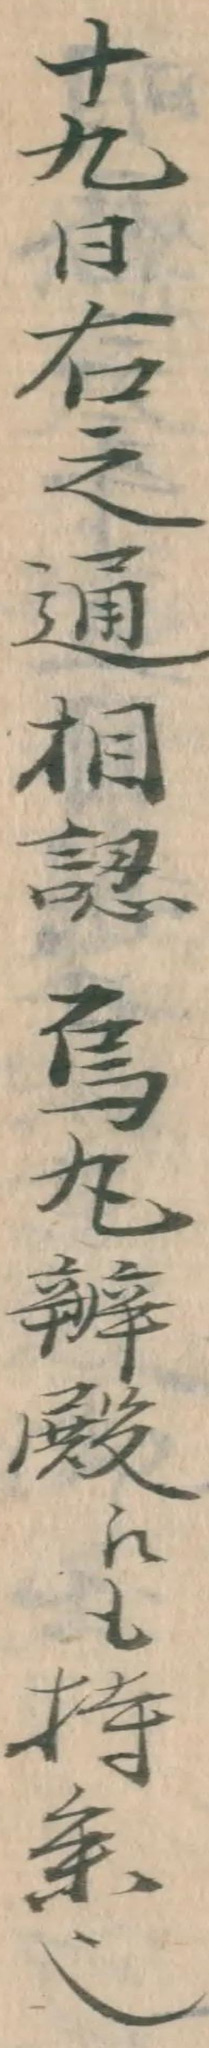十九日右之通相認焉丸弁殿江も持参也
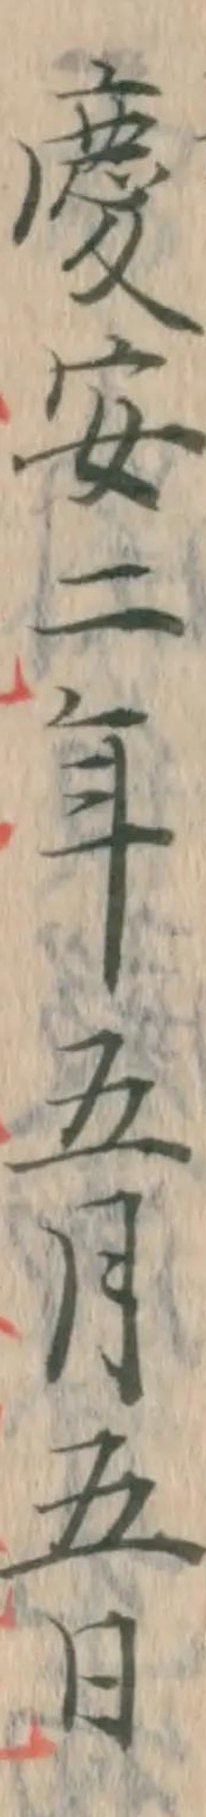慶安二年五月五日
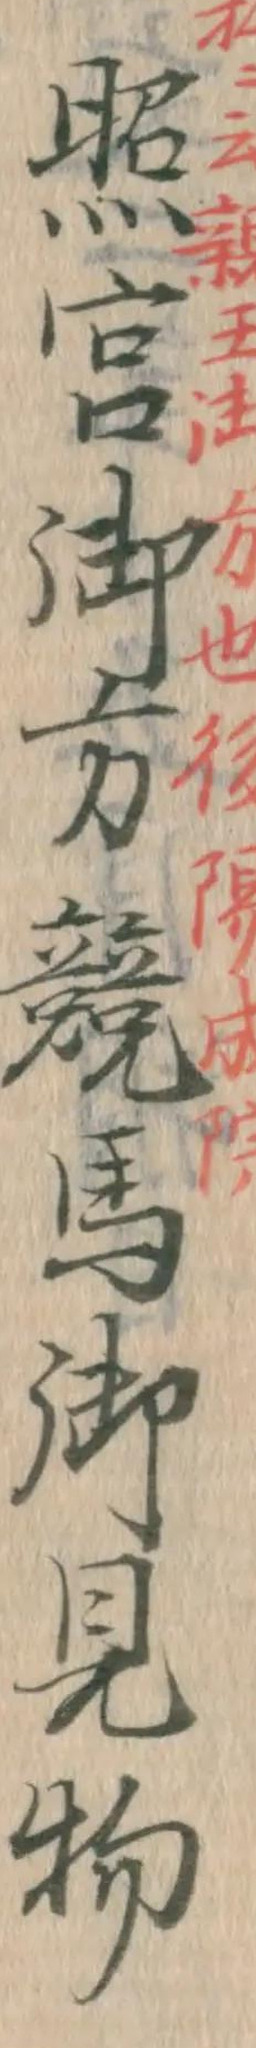照宮御方競馬御見物
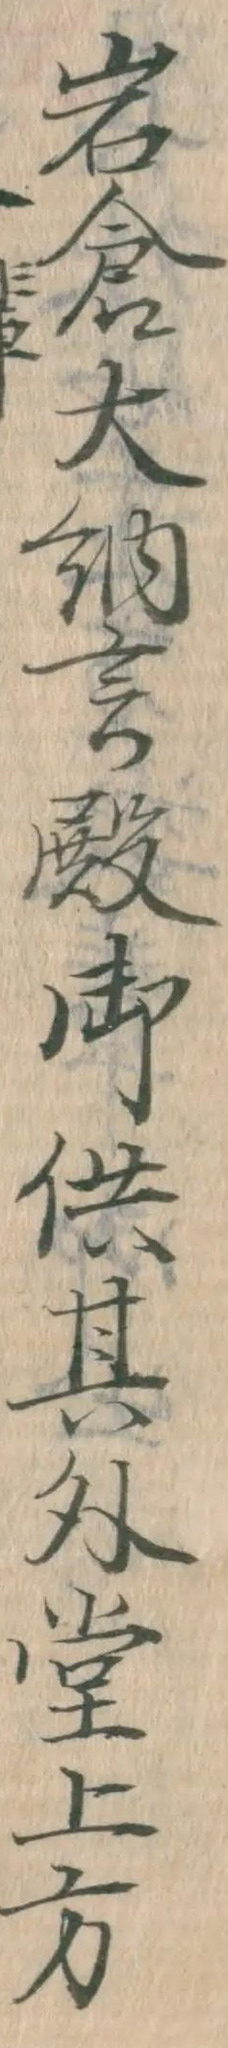岩倉大納言殿御供其外堂上方
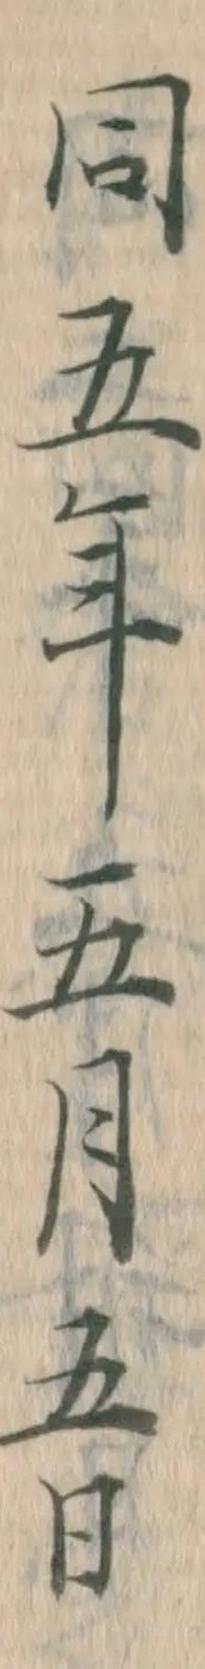同五年五月五日
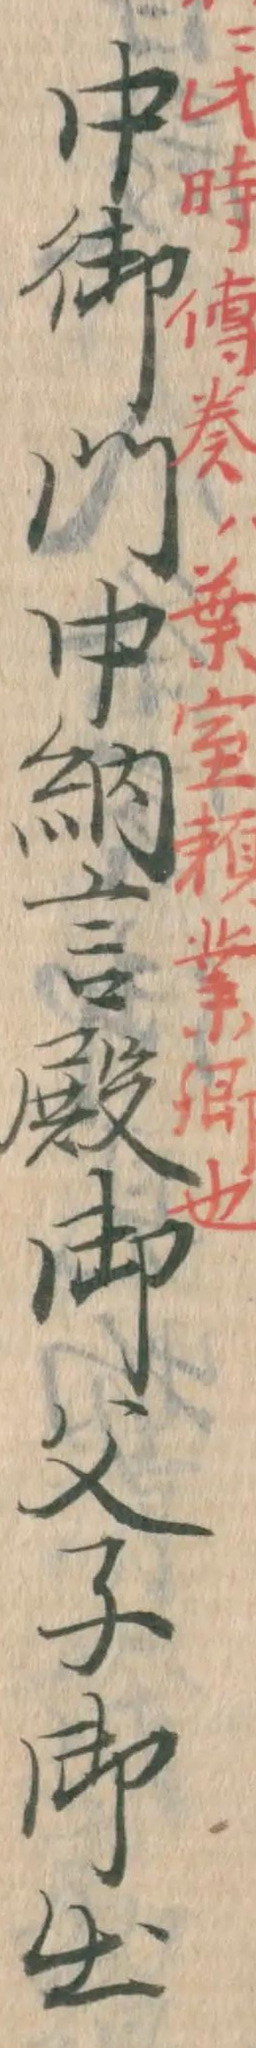中御門中納言殿御父子御出
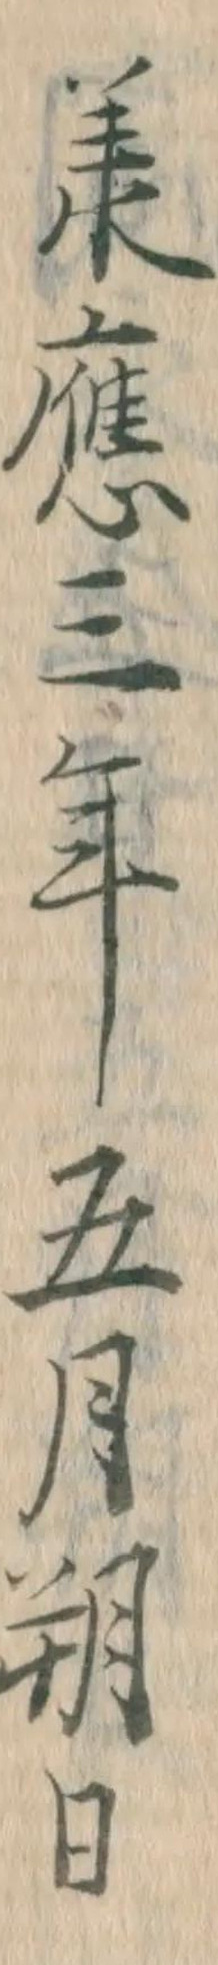承応三年五月朔日
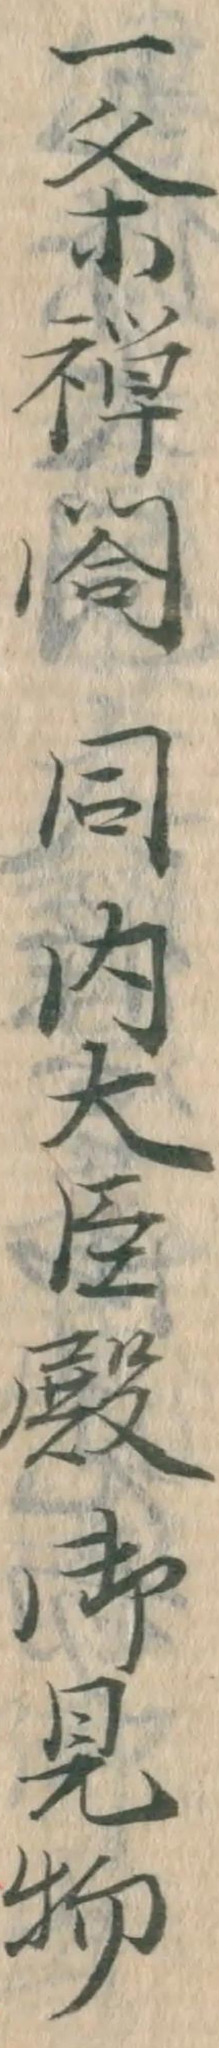一条禅閤同内大臣殿御見物
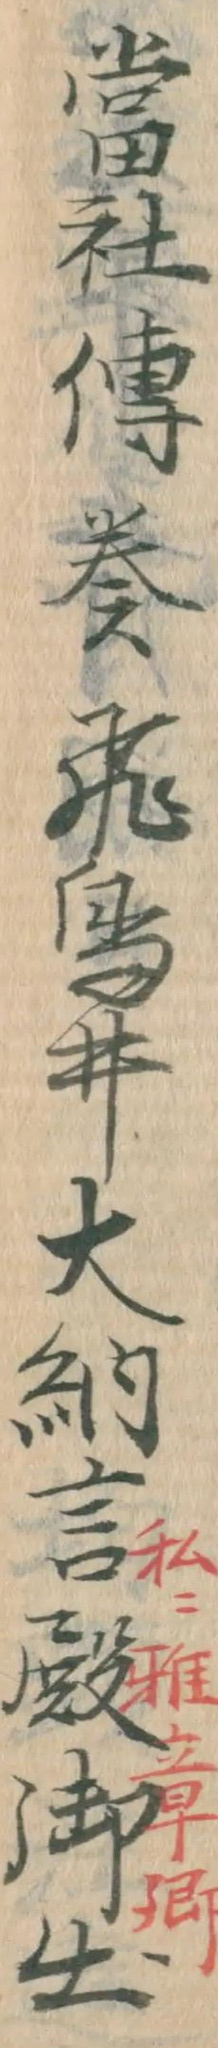当社伝奏飛鳥井大納言殿御出

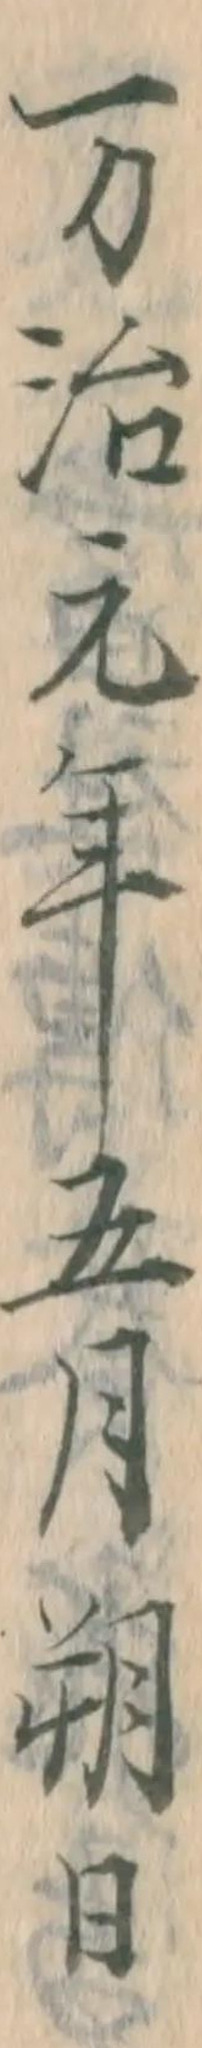万治元年五月朔日
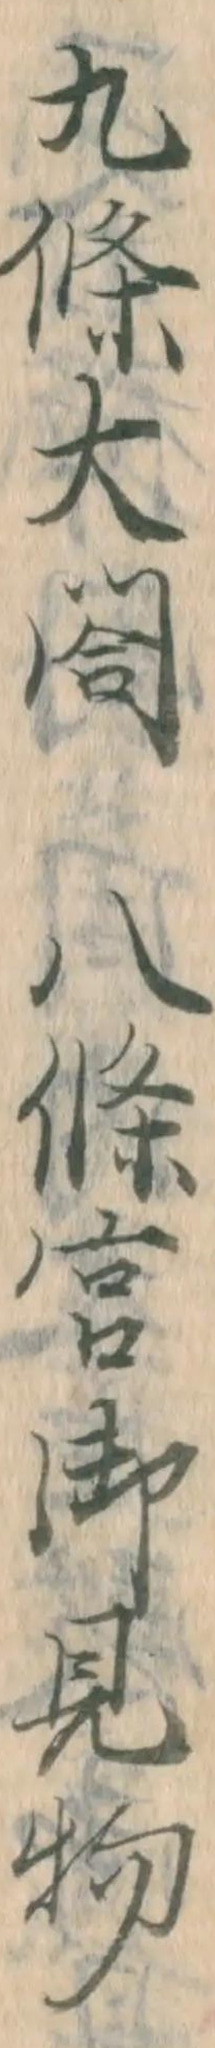九条大閤八条宮御見物
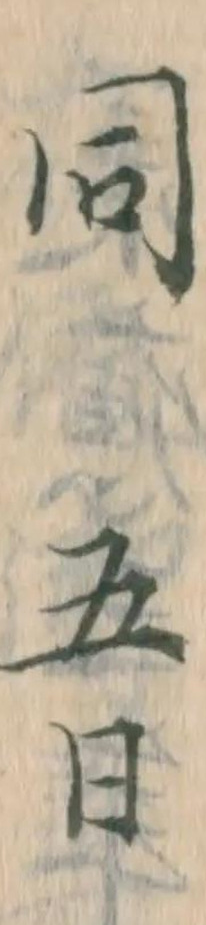同五日
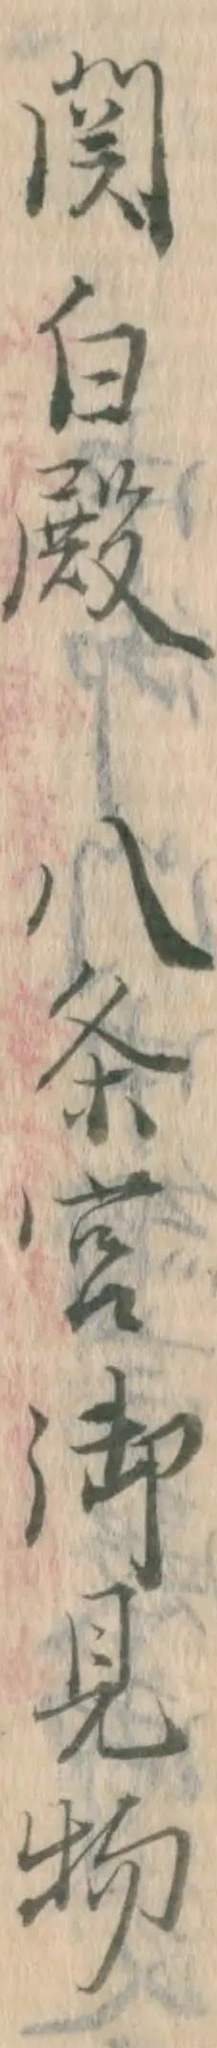関白殿八条筥御見物
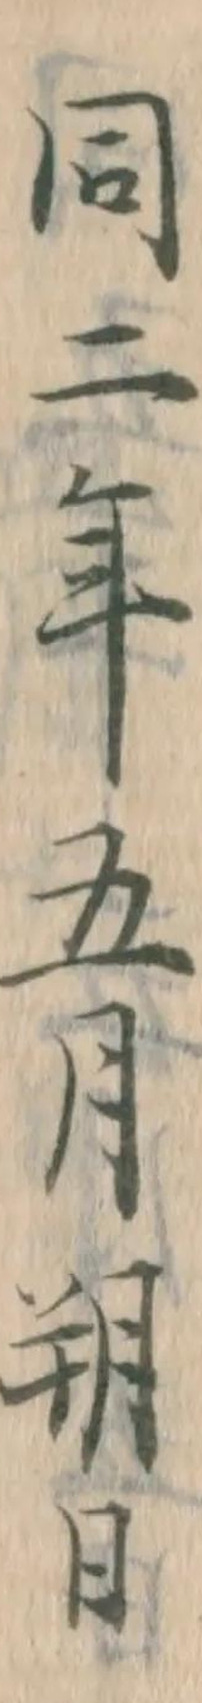同二年五月朔日
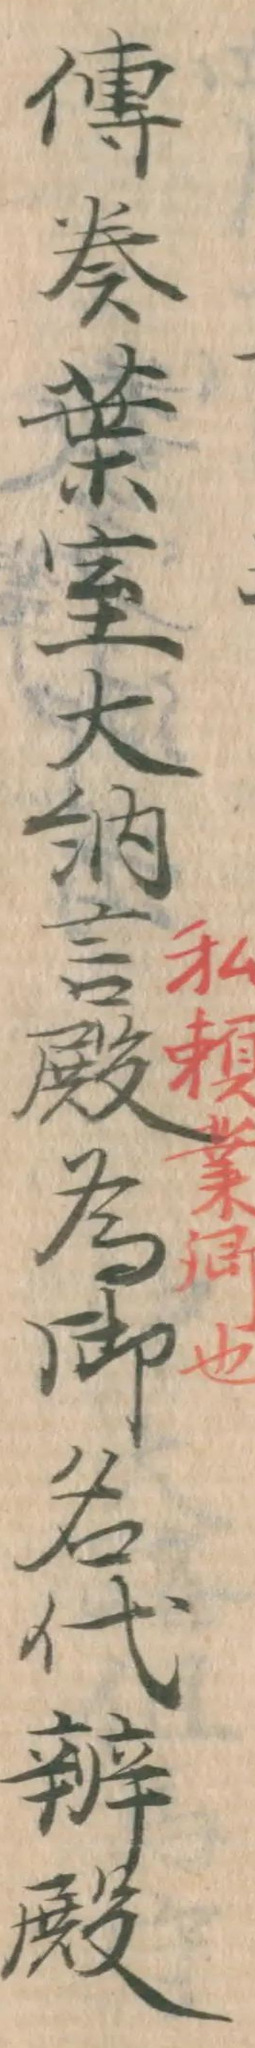伝奏葉室大納言殿為御名代弁殿
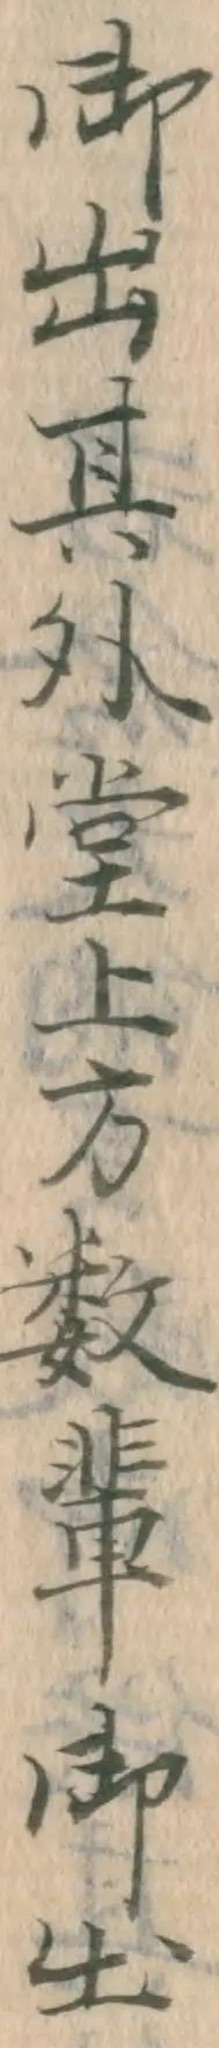御出其外堂上方数輩御出
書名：賀茂社記録. 第10冊
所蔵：国立国会図書館 National Diet Library, JAPAN
